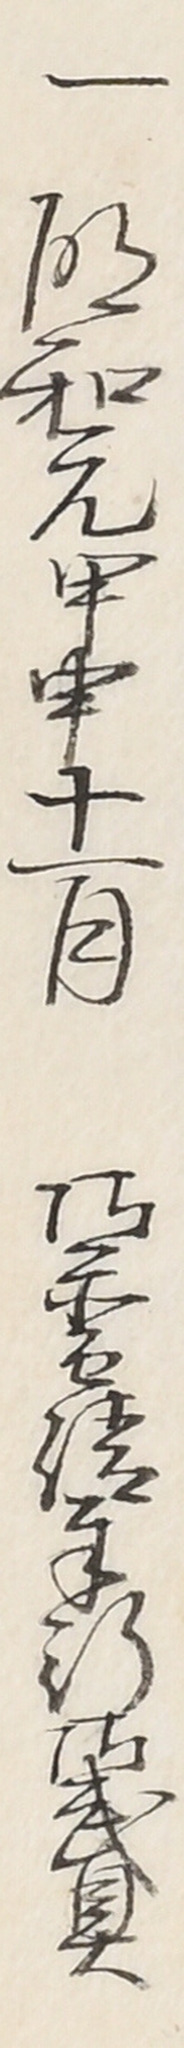一明和元甲申十一月御普請奉行御武具
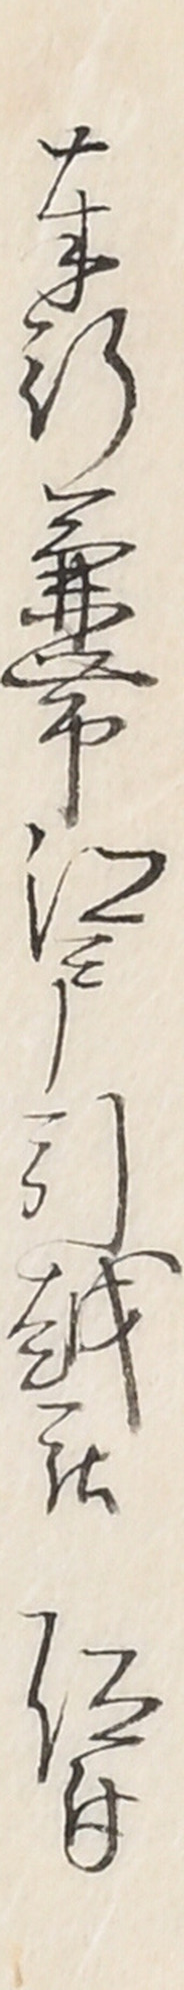奉行兼帯江戸引越被仰付
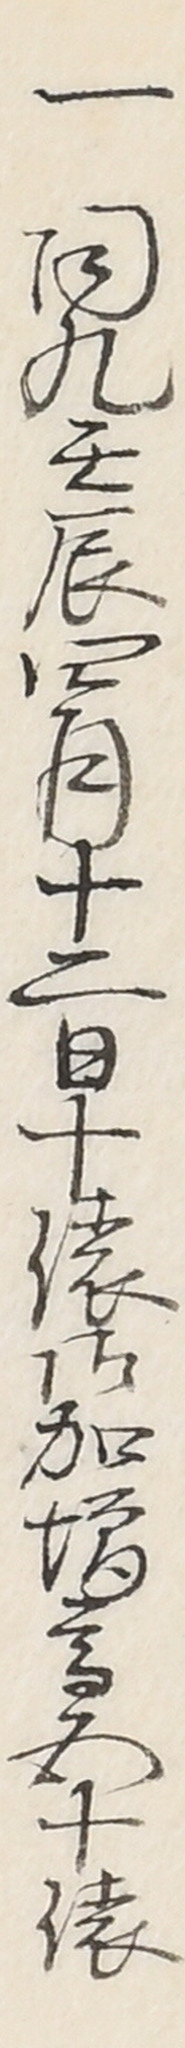一同九壬辰四月十二日十俵御加増高五十俵
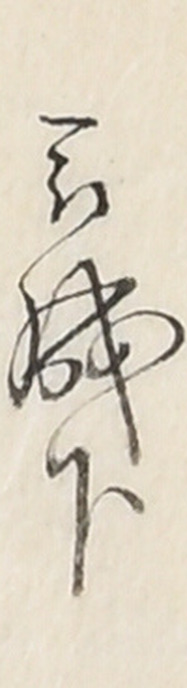被成下
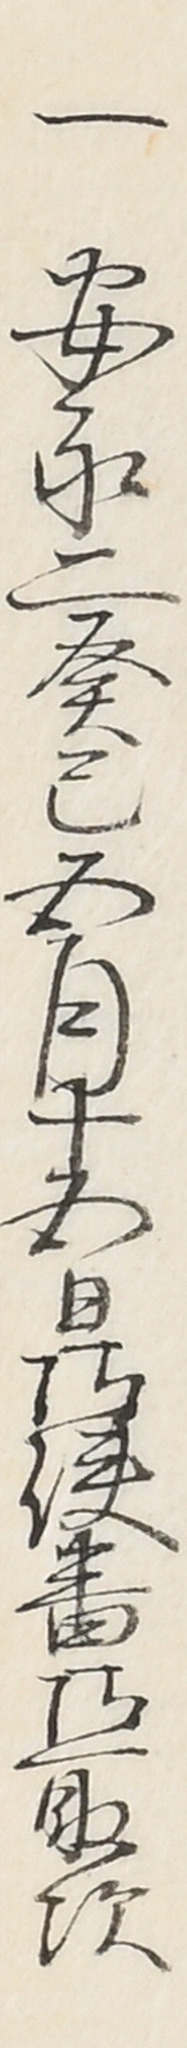一安永二癸巳五月十五日御使番御取次
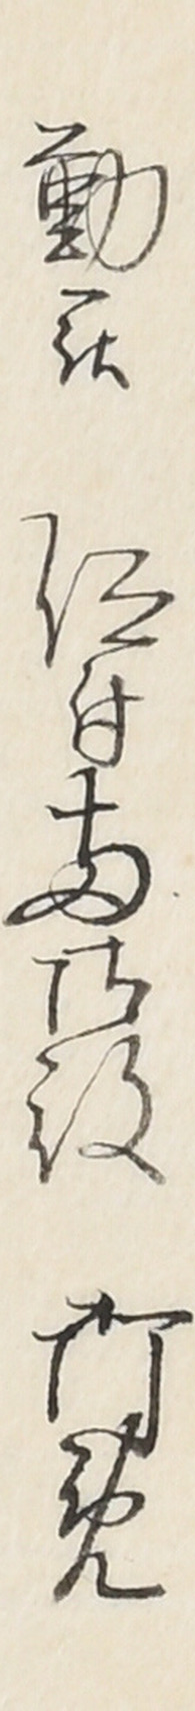勤被仰付両御役御免
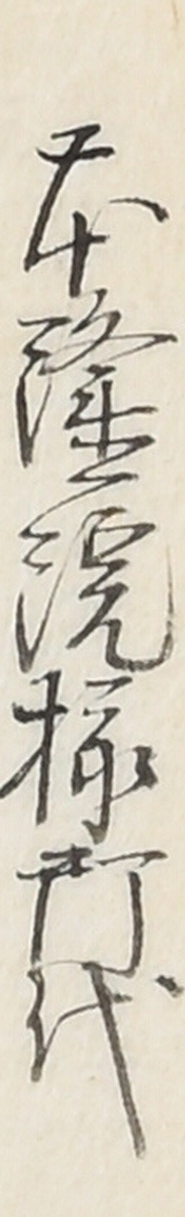本隆院様御代
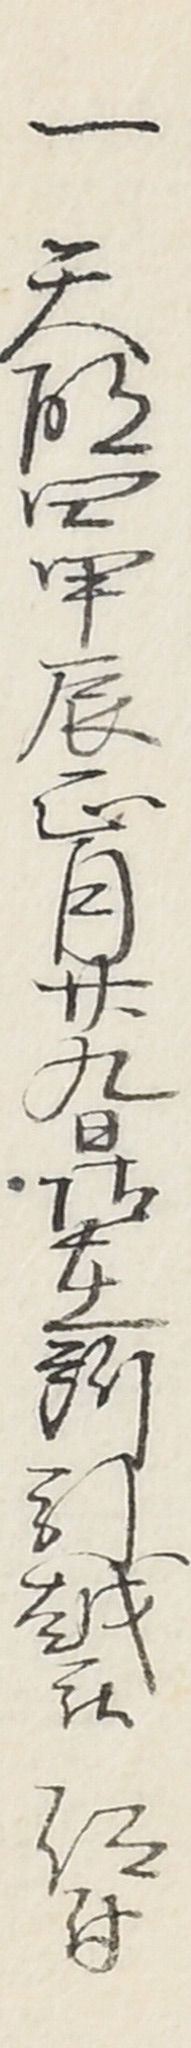一天明四甲辰正月廿九日御在所引越被仰付
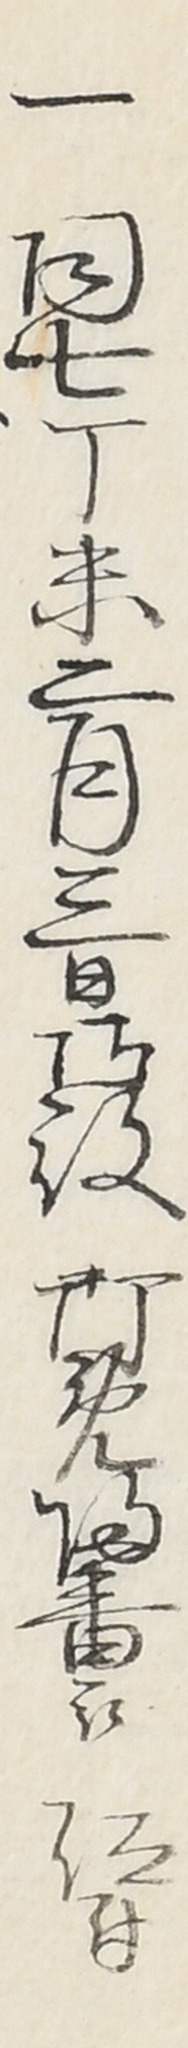一同七丁未二月三日御役御免帰番被仰付
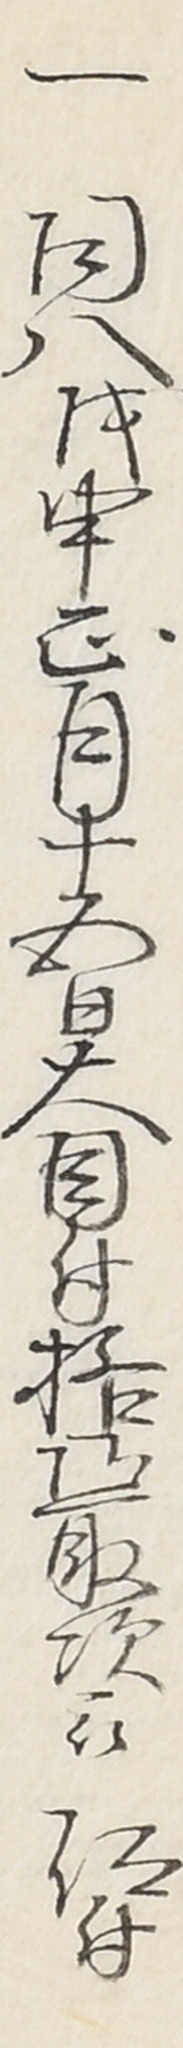一同八戊申正月十五日大目付格御取次被仰付
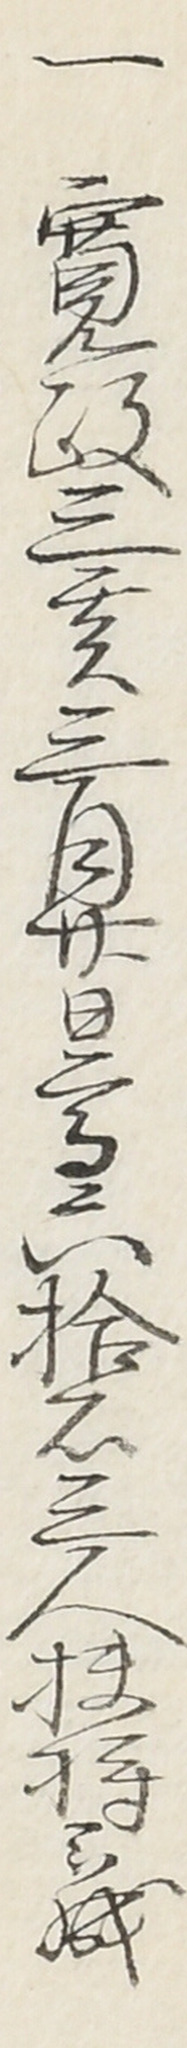一寛政三亥三月廿日高六拾石三人扶持被成
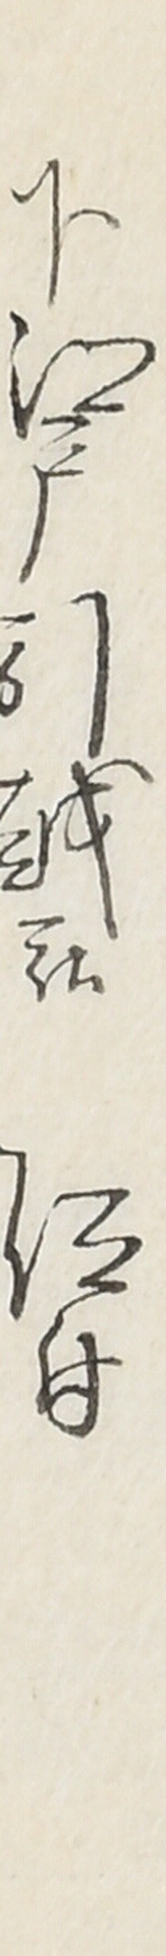下江戸引越被仰付
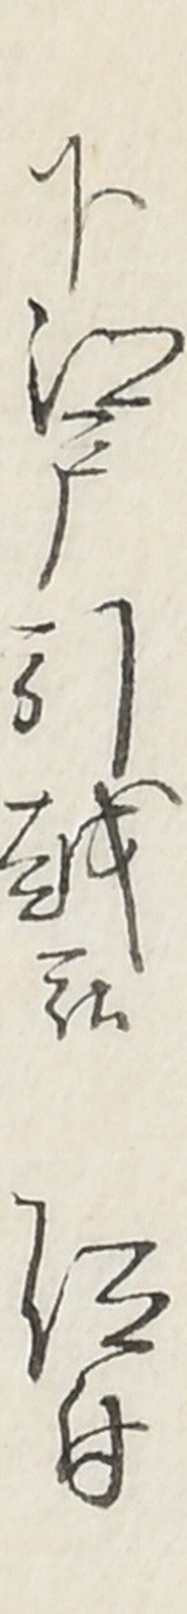下江戸引越被仰付
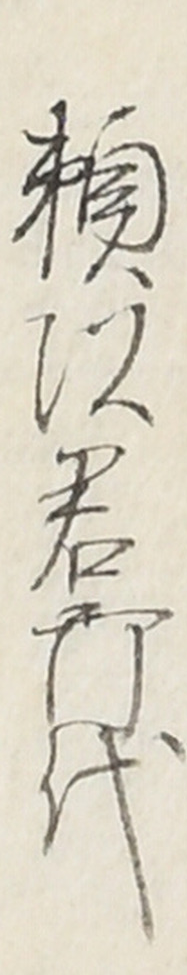頼以君御代
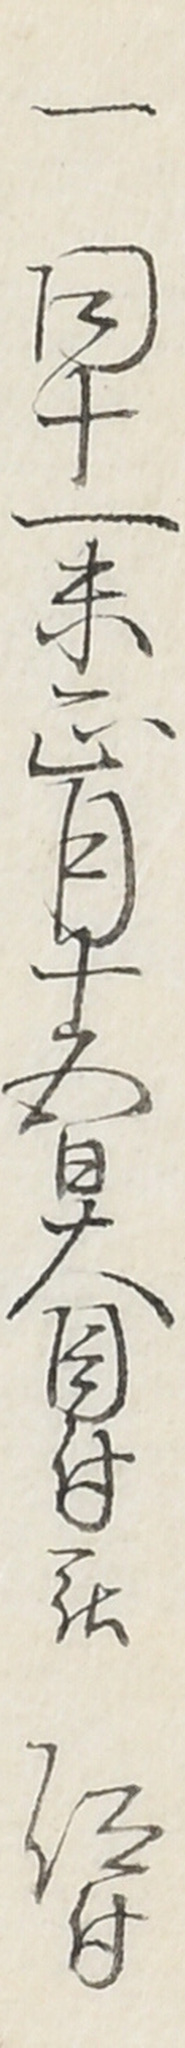一同十一未正月十五日大目付被仰付
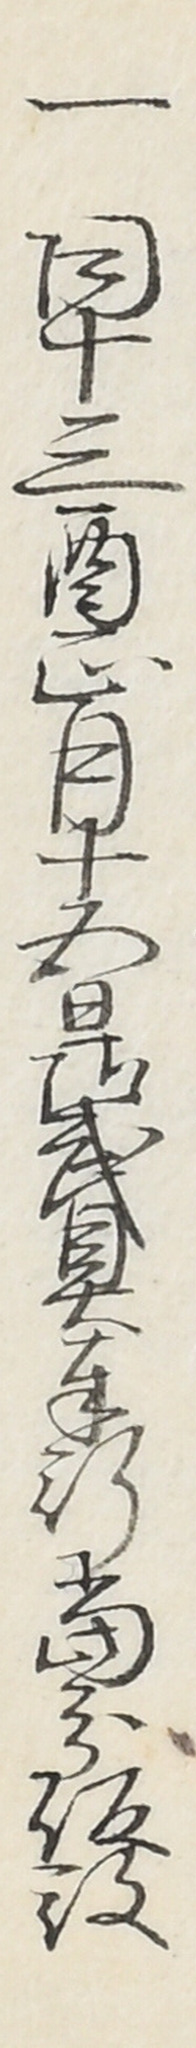一同十三酉正月十五日御武具奉行当分仮役
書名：給人諸士勤仕録（七）
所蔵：伊那市立高遠町図書館・合同会社AMANE
